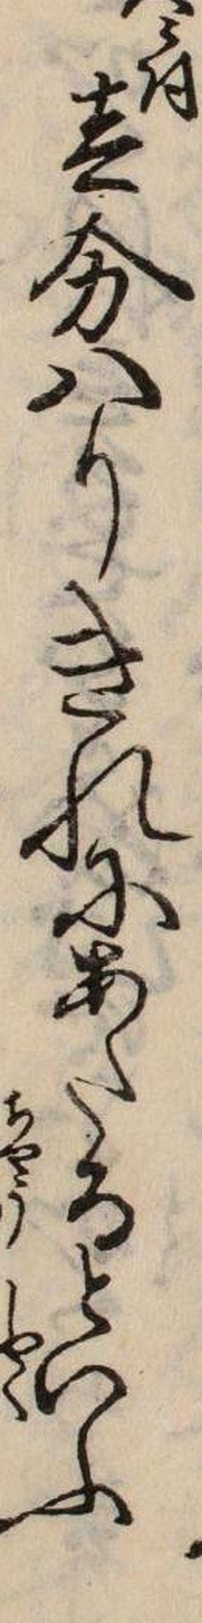一尺に付壱分八りきれにあたるといふ
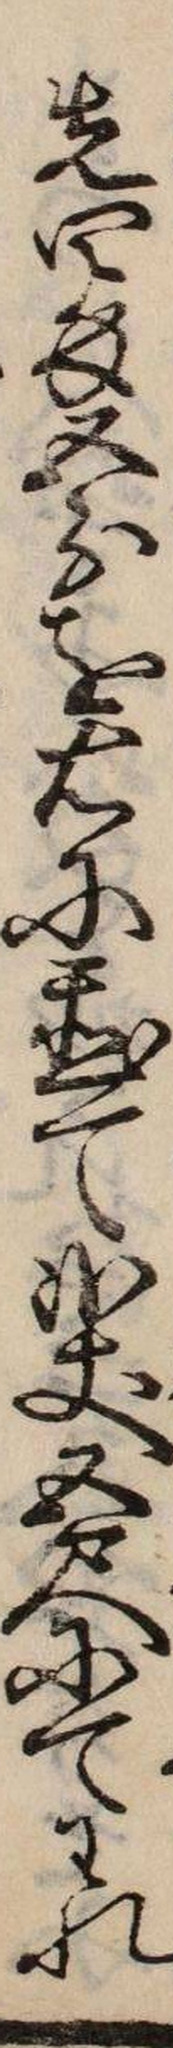先四匁五分を右に置て弐丈五尺にてわれ
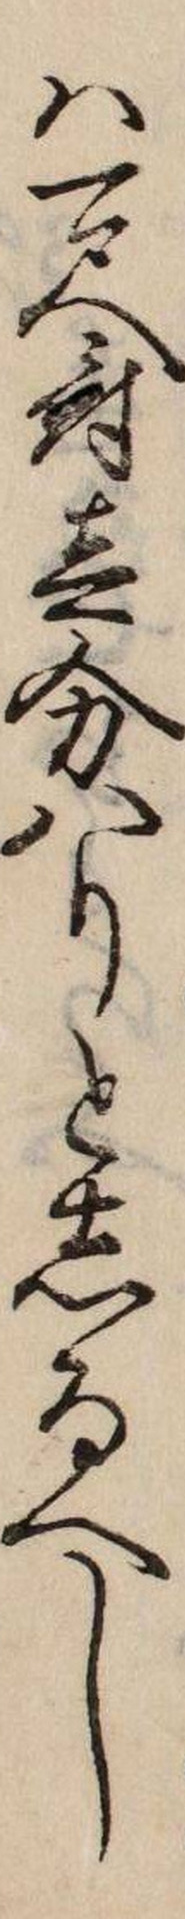は一尺に付壱分八りとしるへし
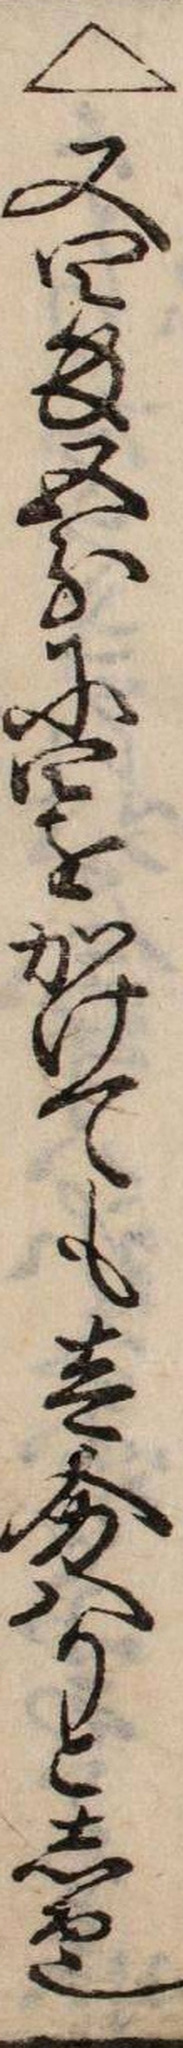△又四匁五分に四をかけても壱分八りとしる也
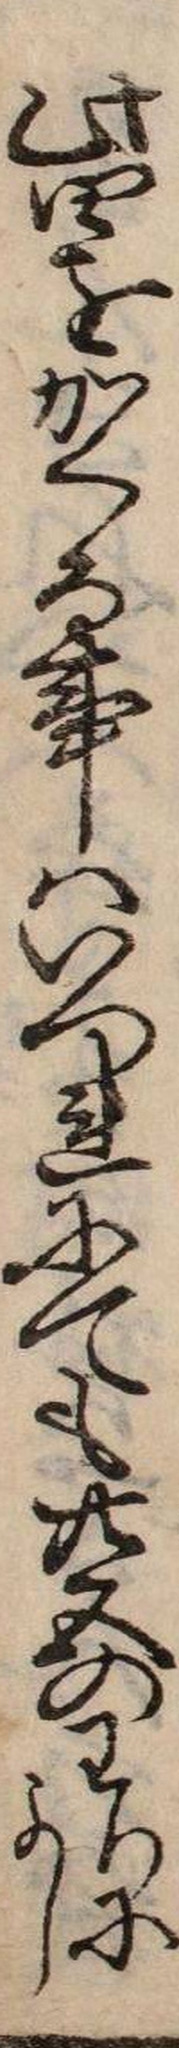此四をかくる事はいつれにても廿五のわりによし

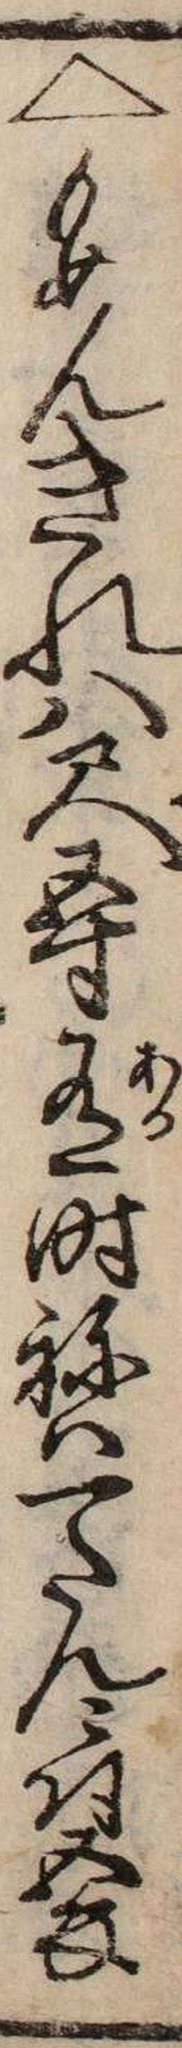△もめんきれ八尺五寸有時ねは一たんに付五匁
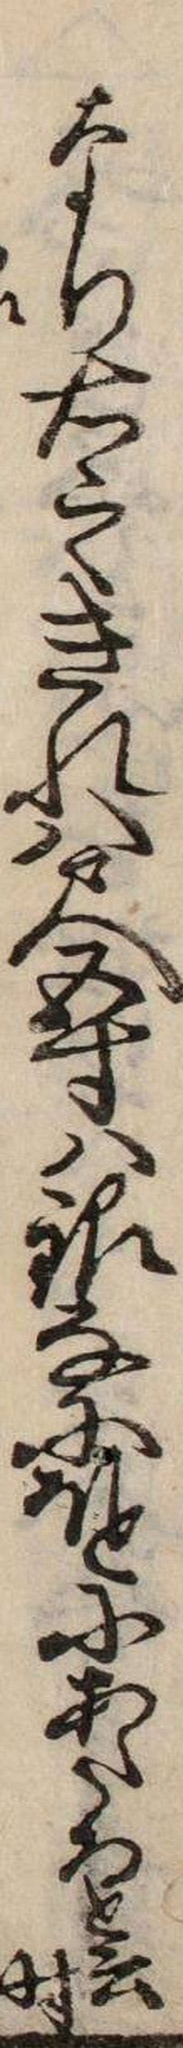なり右のきれ八尺五寸は銀なにほとにあたると云時
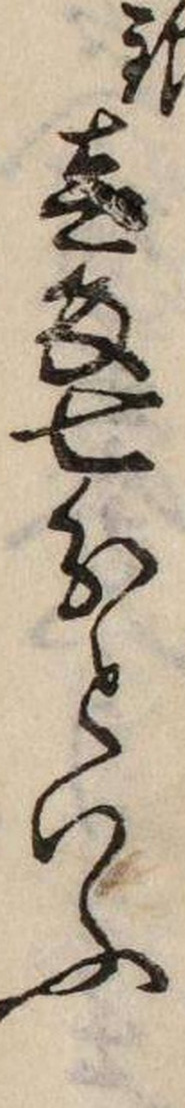銀一匁七分といふ
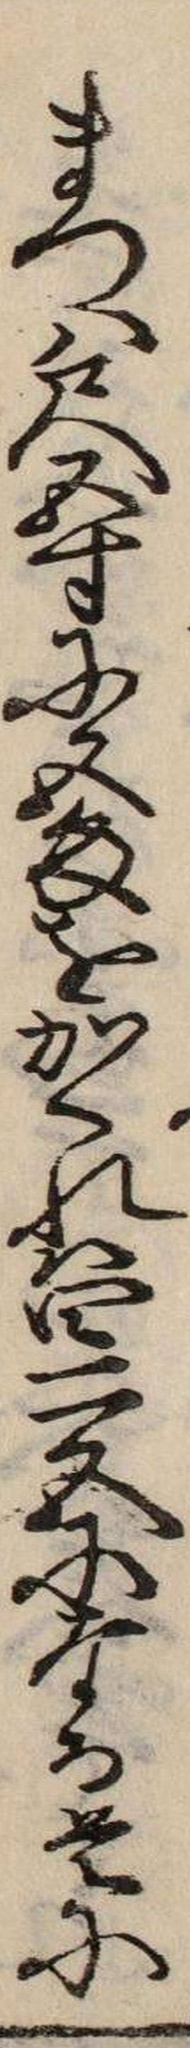まつ八尺五寸に五匁をかくれは四二五になる是に
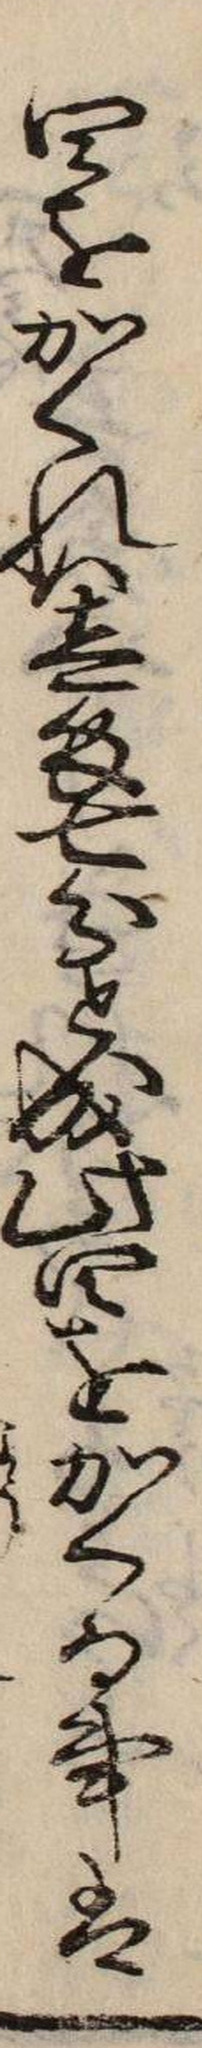四をかくれは壱匁七分と成此四をかくる事は
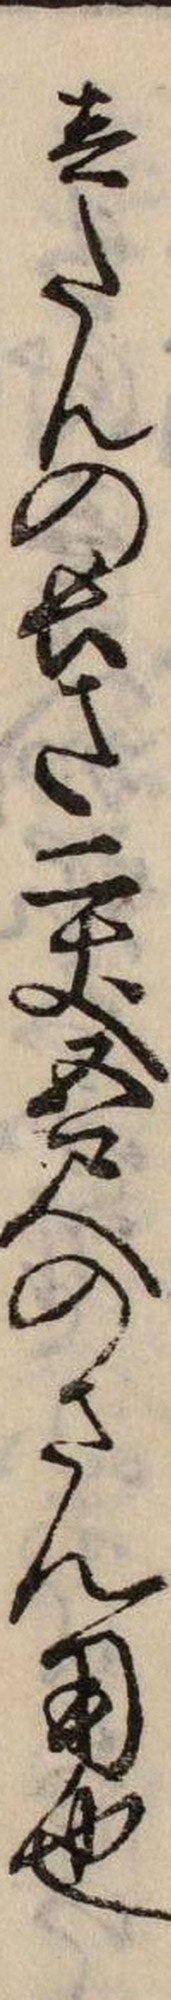壱たんの長さ二丈五尺のさん用也
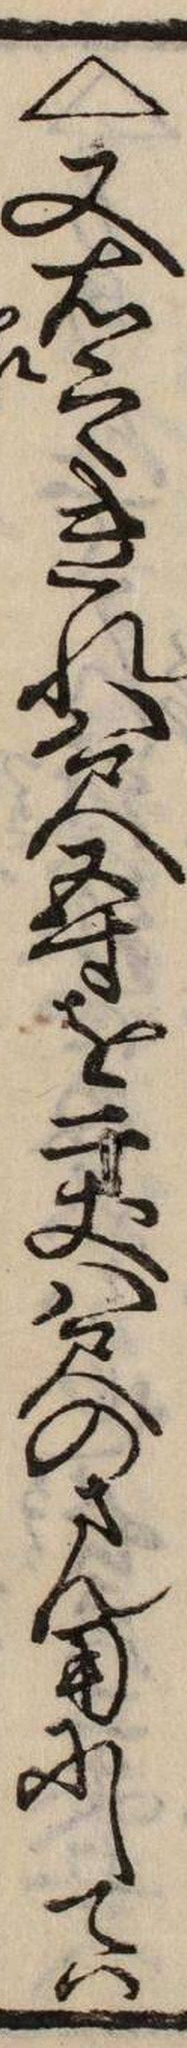△又右のきれ八尺五寸を二丈八尺のさん用にしては
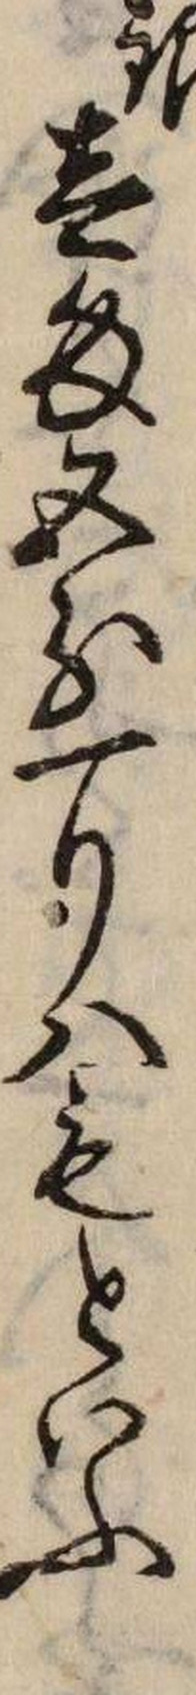銀壱匁五分一り八毛といふ
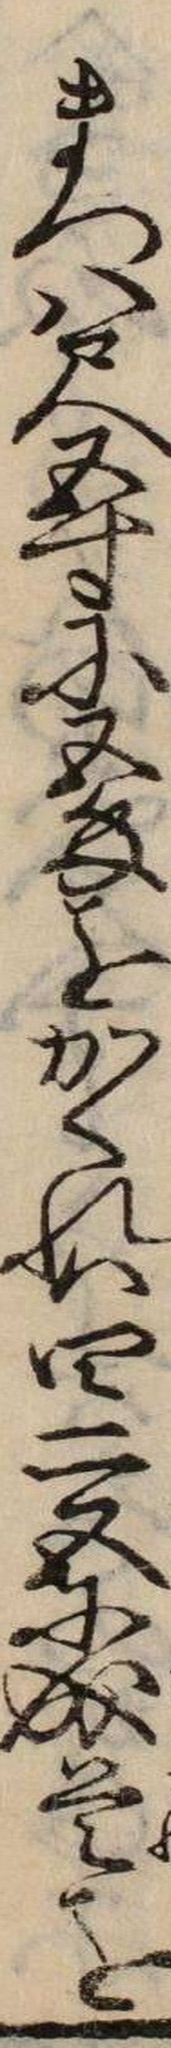まつ八尺五寸に五匁をかくれは四二五に成是を
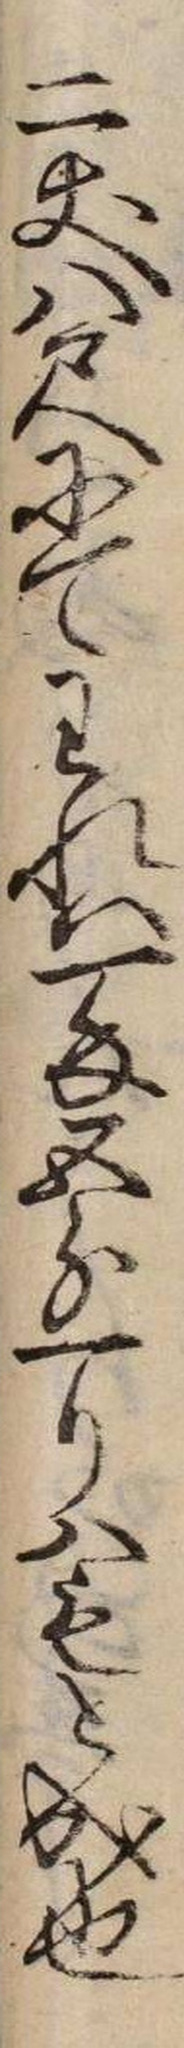二丈八尺にてわれは一匁五分一り八毛と成也
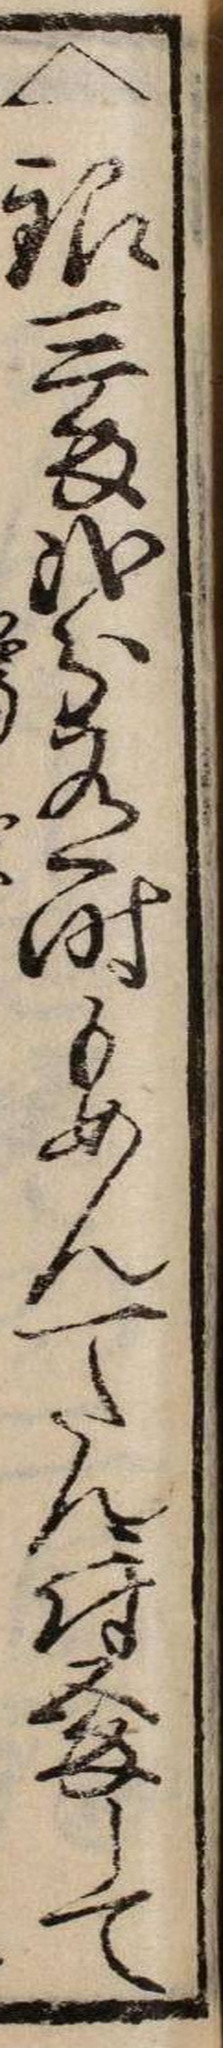△銀三匁弐分有時もめん一たんに付五匁して
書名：塵劫記（寛永11年自跋、京都府立京都学・歴彩館追貴8）
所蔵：京都府立京都学・歴彩館 国文学研究資料館
